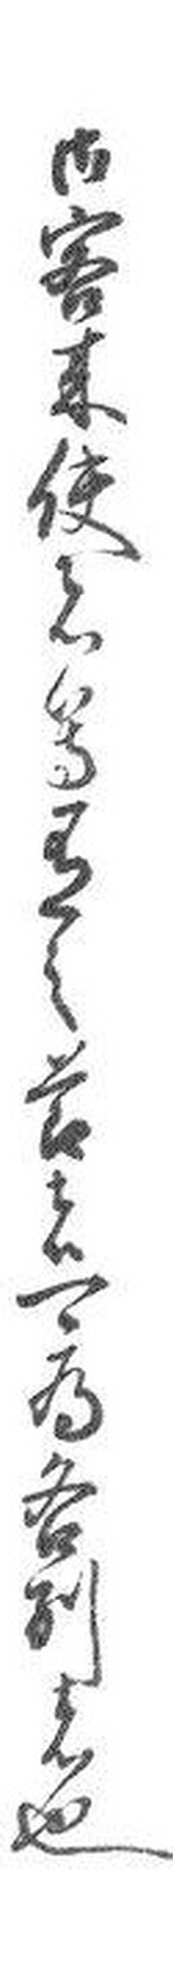御客来使者等有之節者可為各別者也
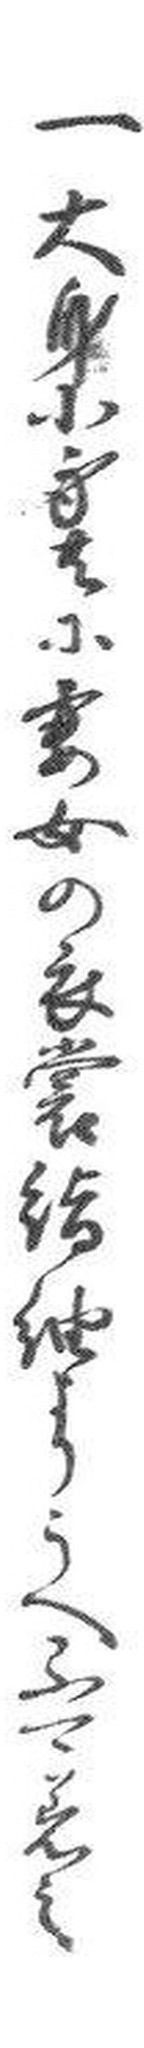一大身小身共に妻女の衣裳絹紬よりうへ不可着之
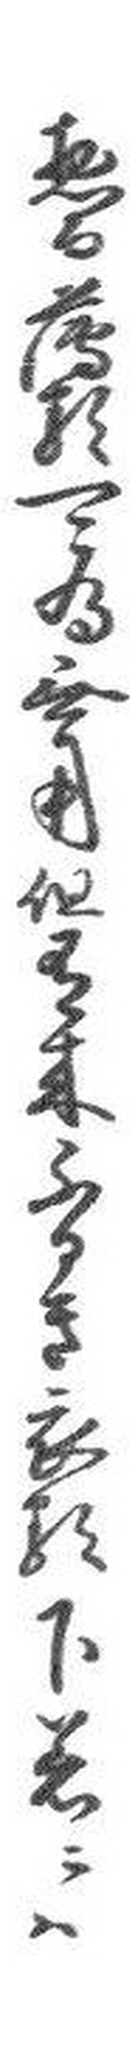惣而薄類可為無用但有来ふるき衣類下着ニは
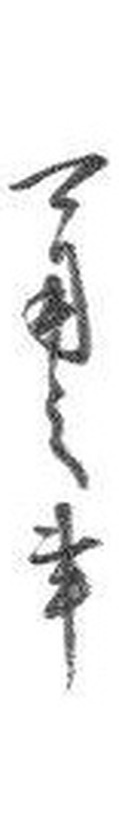可用之事
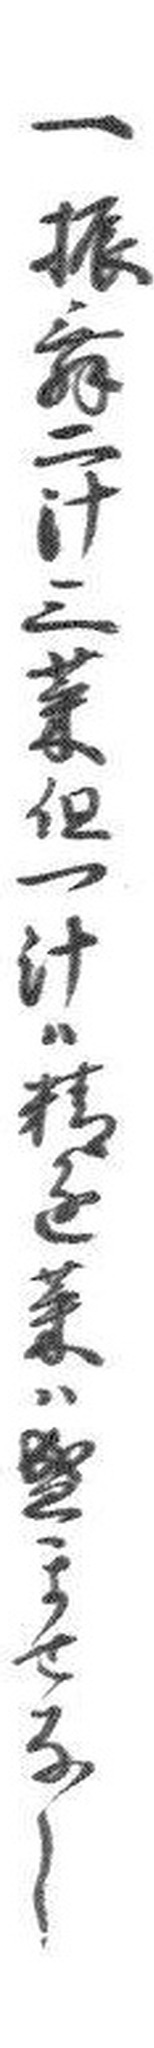一振舞二汁三菜但一汁は精進菜は盛ませなし
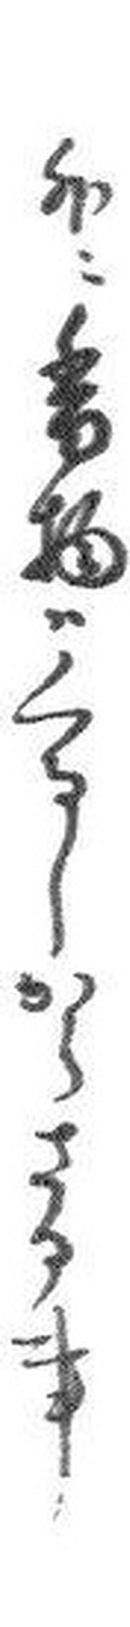外ニ香物はくるしからさる事
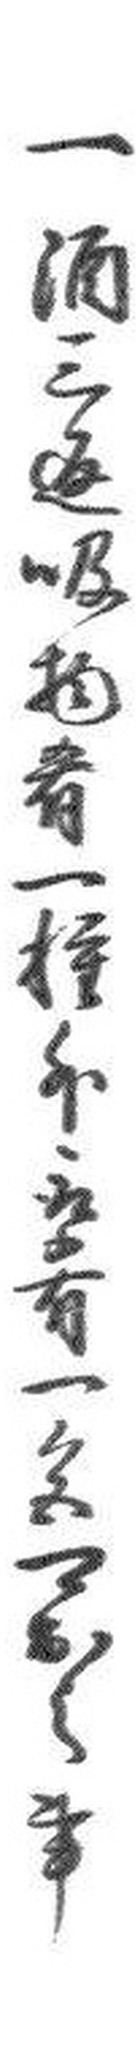一酒三返吸物肴一種外取肴一色可出之事
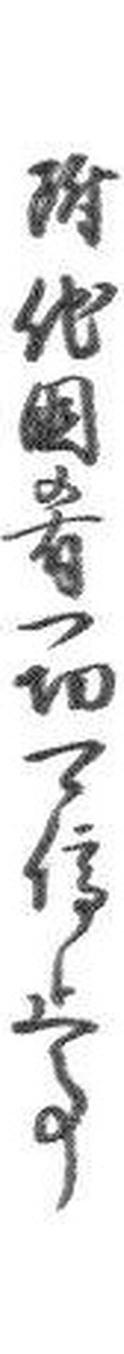附他国肴一切可停止事
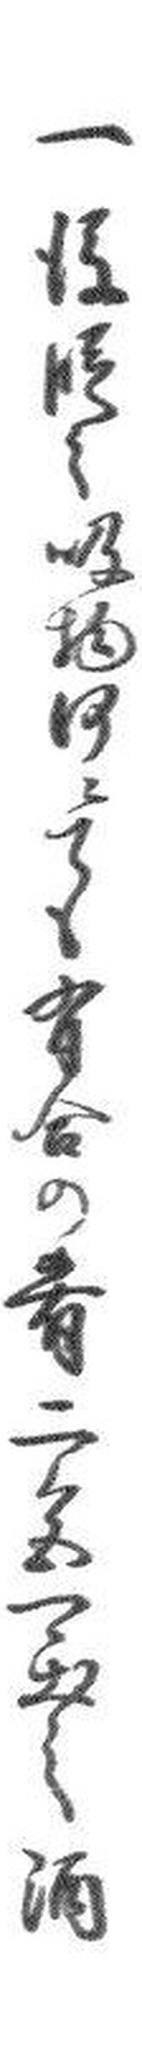一後段之吸物何ニても有合の肴二色可出之酒
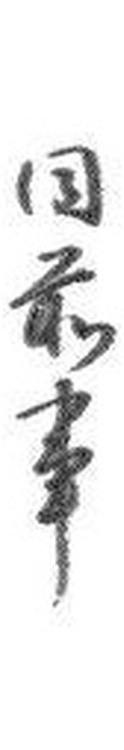同前事
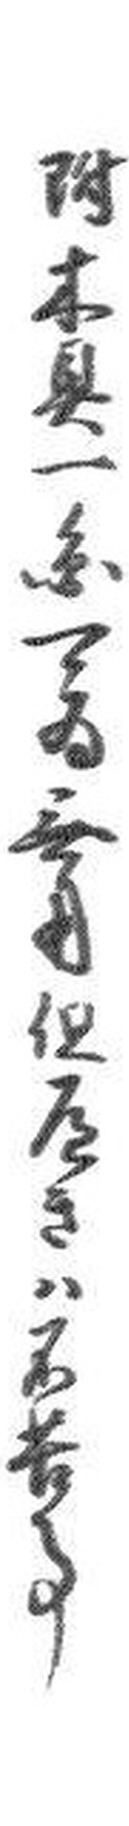附木具一円可為無用但道きは不苦事
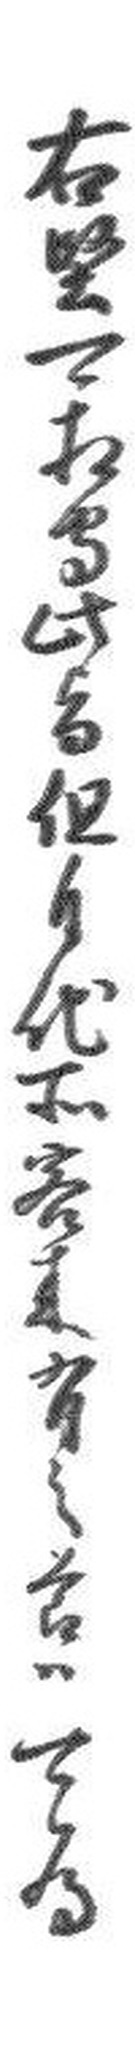右堅可相守此旨但自他所客来有之節は可為
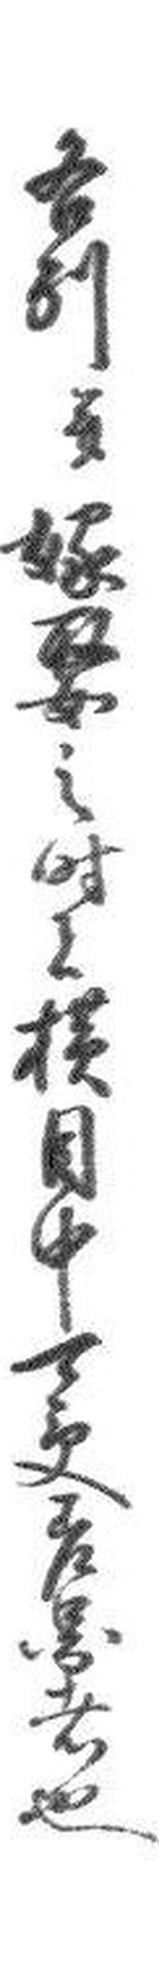各別并嫁娶之時は横目中可受差図者也

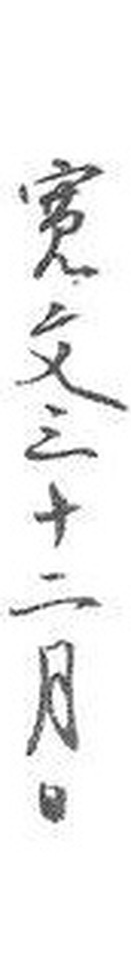寛文三十二月日
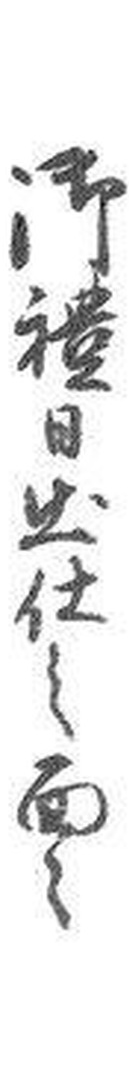御礼日出仕之面々
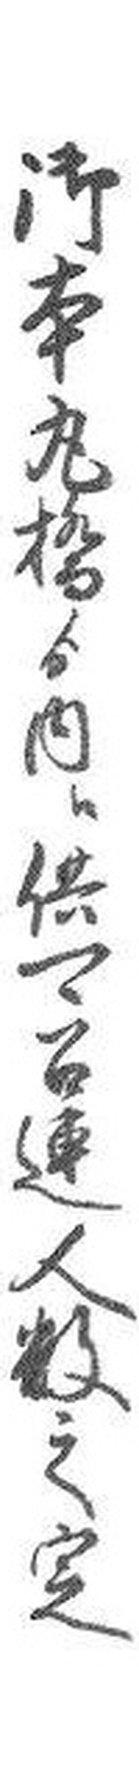御本丸橋ゟ内江供可召連人数之定
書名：家譜 六 光通公 従万治三年到寛文三年
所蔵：福井県文書館 Fukui Prefectural Archives
